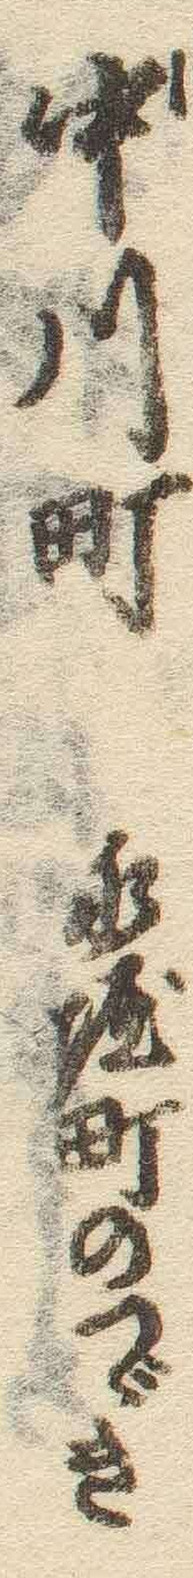中川町永掘町のつゞき
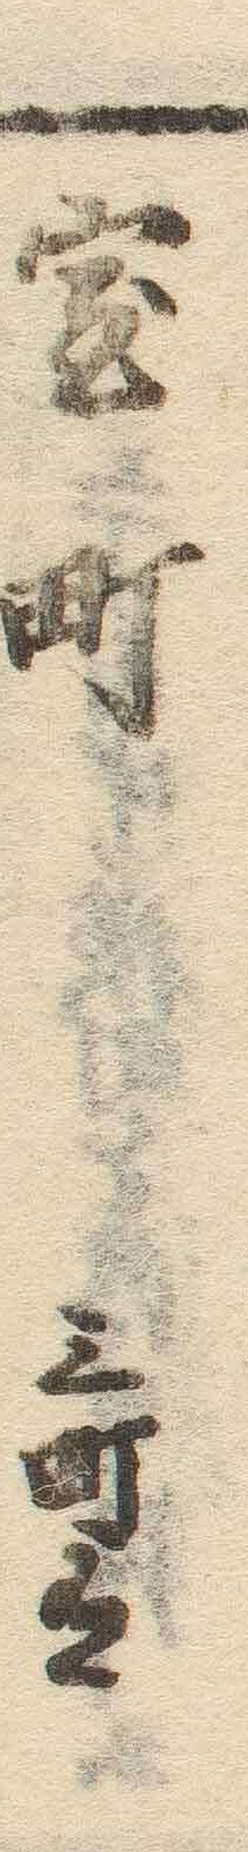室町三町有
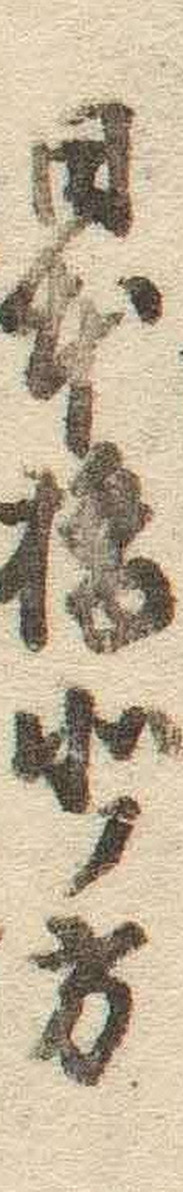日本橋北ノ方
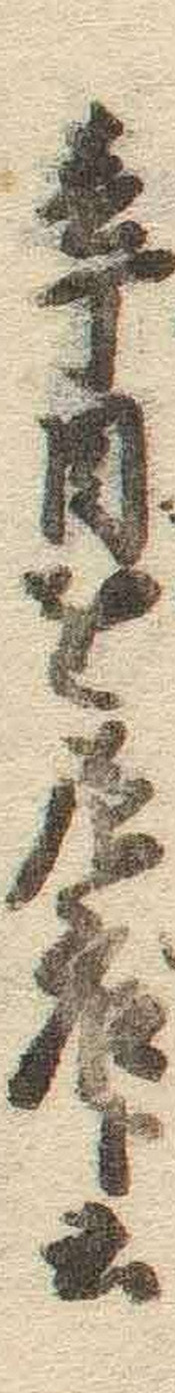壱丁目を尼店ト云

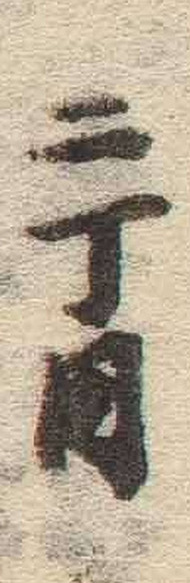二丁目
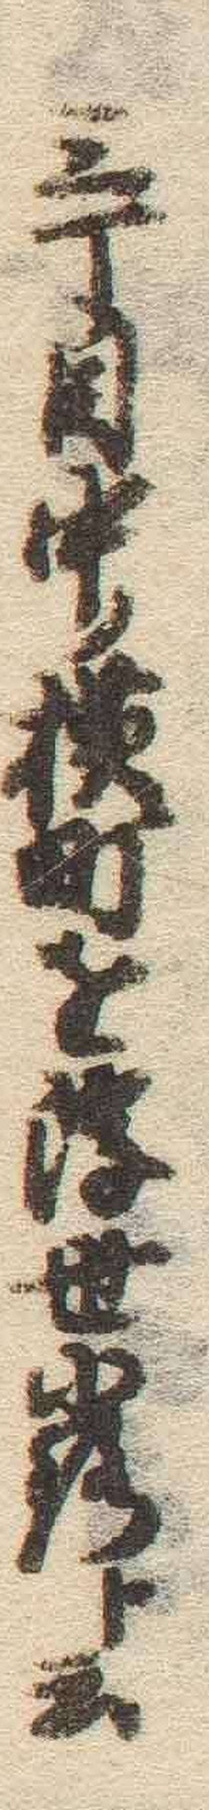三丁目中ノ横町を浮世小路ト云
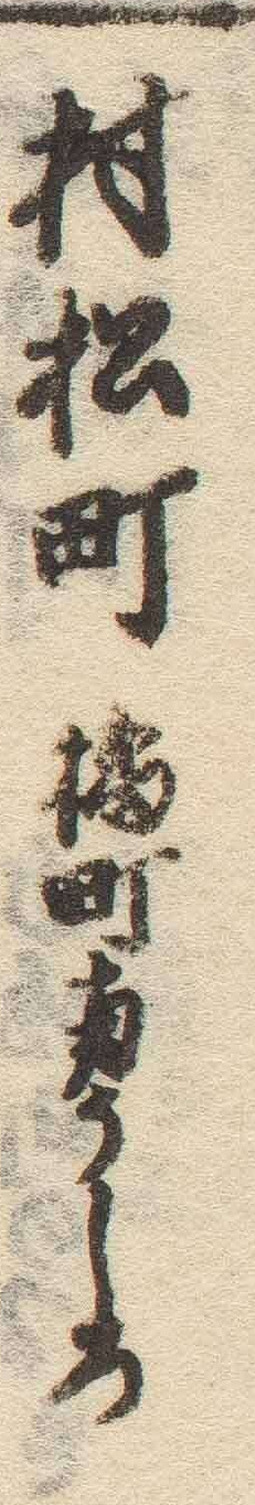村松町橘町南うしろ
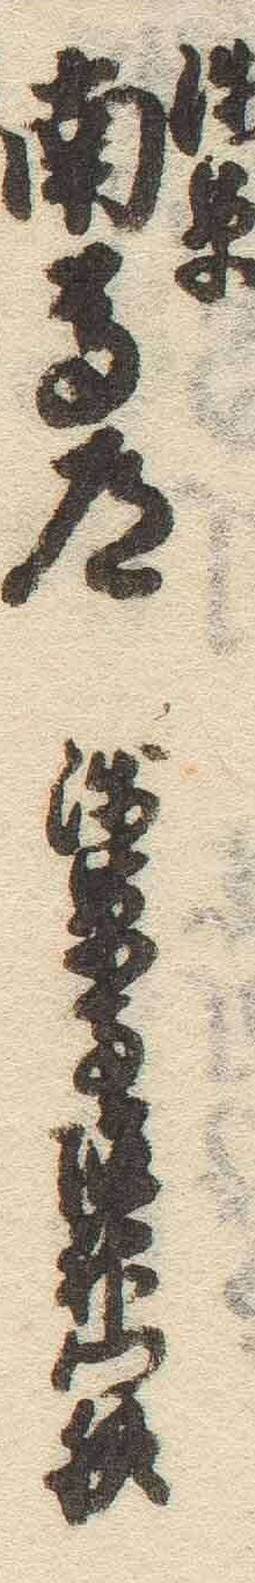南馬道浅草寺随神門脇
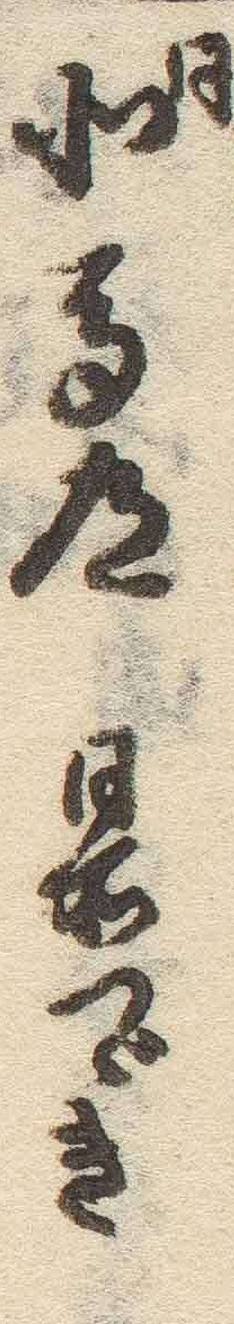北馬道同所つゞき
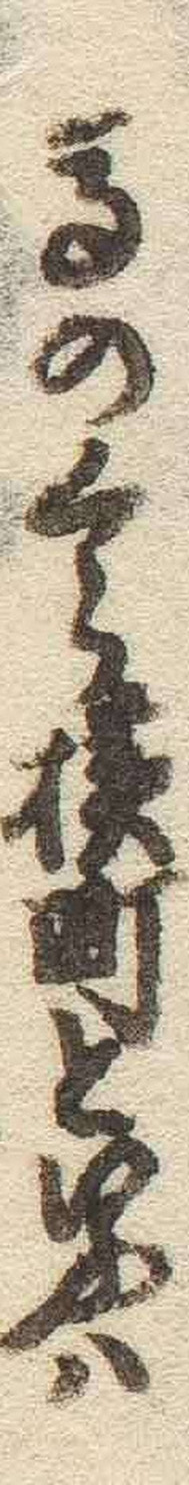馬のくら横町といふは
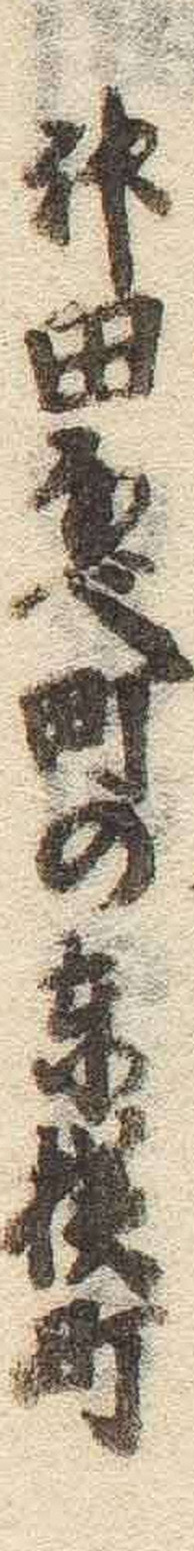神田なべ町の東横町
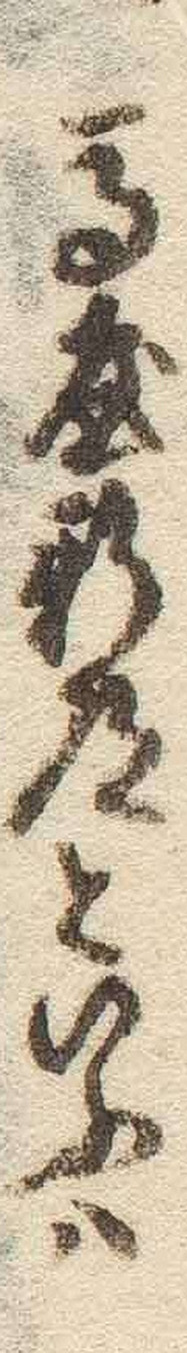馬屋新道といふは
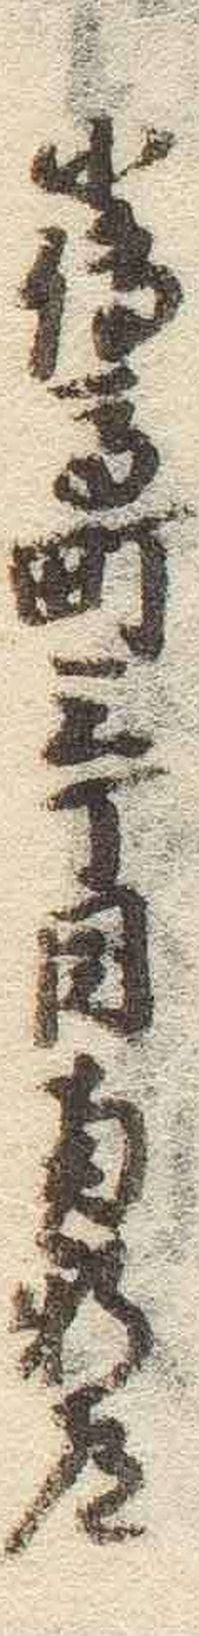小伝馬町三丁目南新道
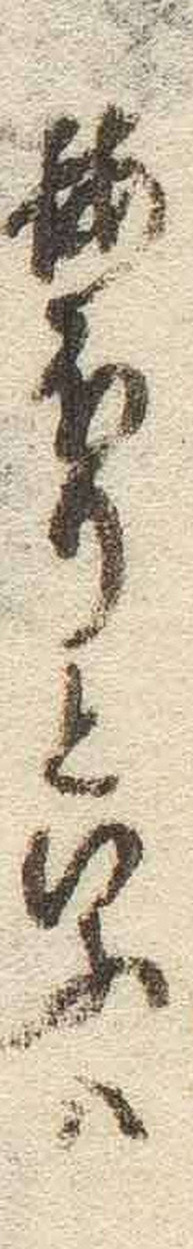梅ほりといふは
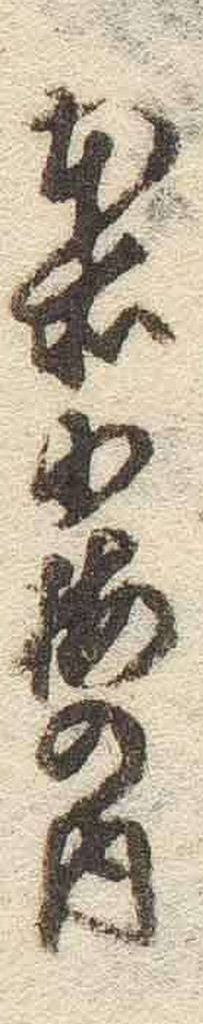本所小梅の内
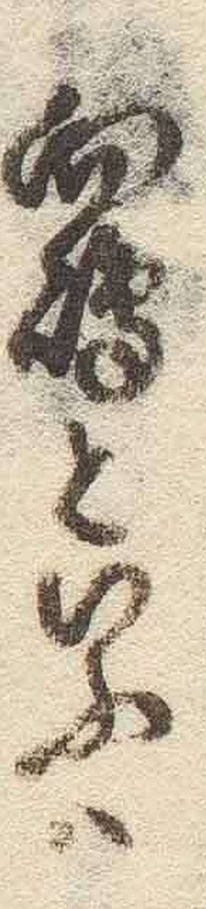向島といふは
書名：江戸町独案内
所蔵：東京学芸大学附属図書館 国文学研究資料館
